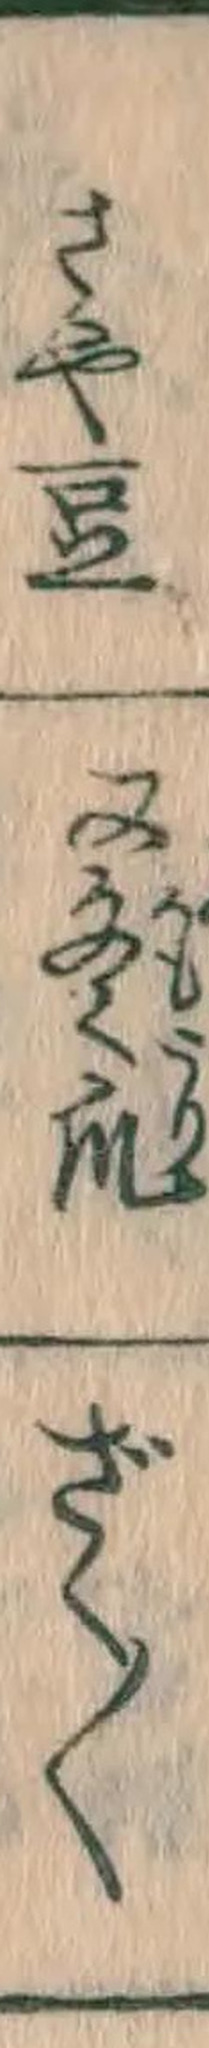さや豆又冬瓜ざく〳〵
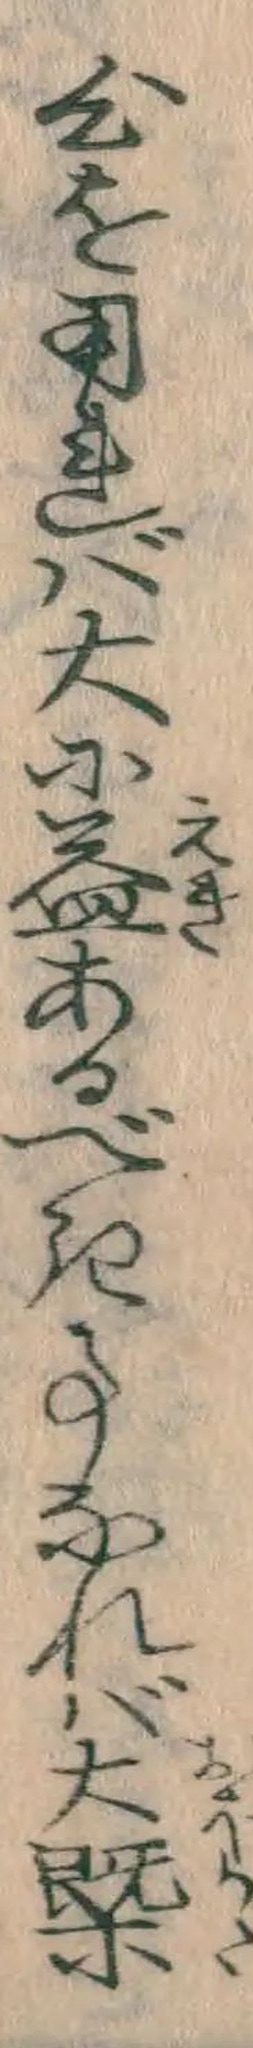心を用れば大に益あるべき事なれば大概
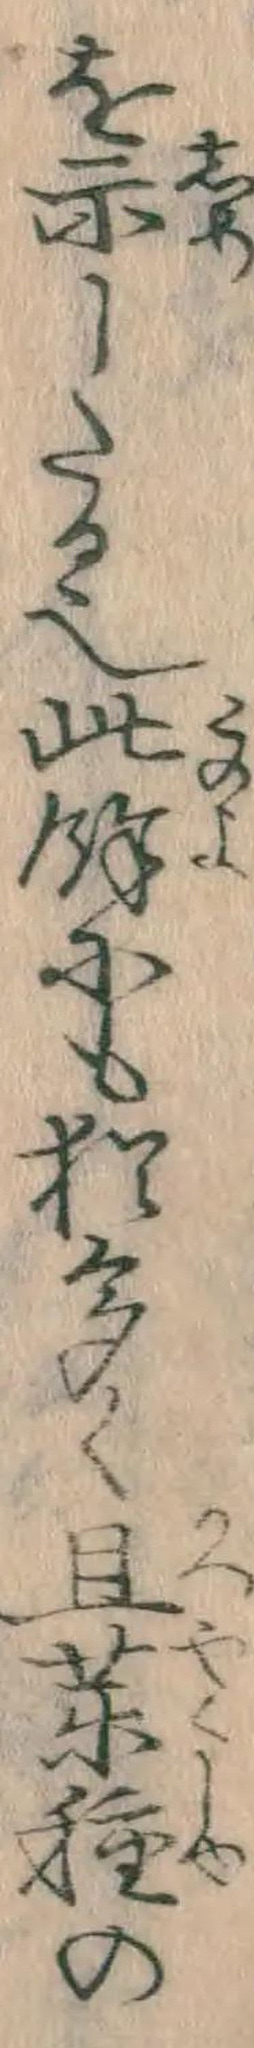を示したる也此余にも猶多く且薬種の
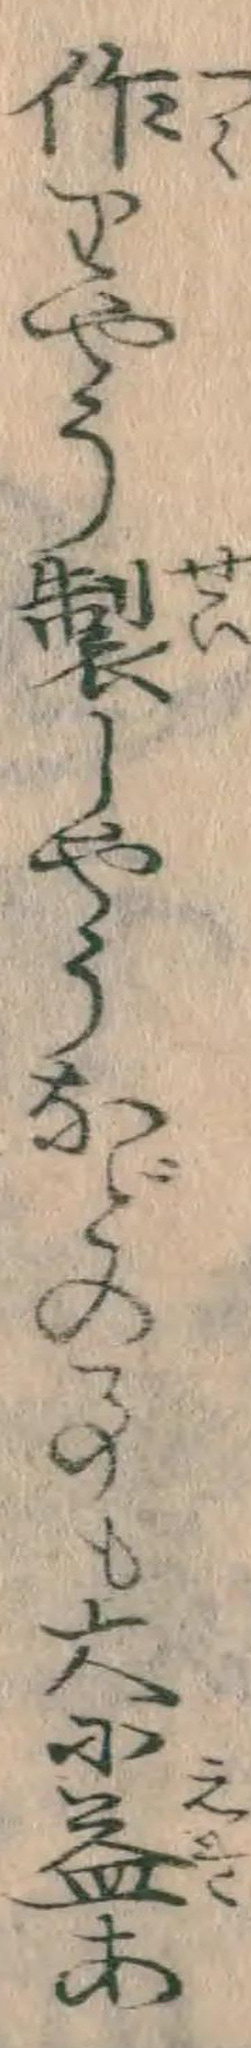作りやう製しやうなどの事も大に益あ
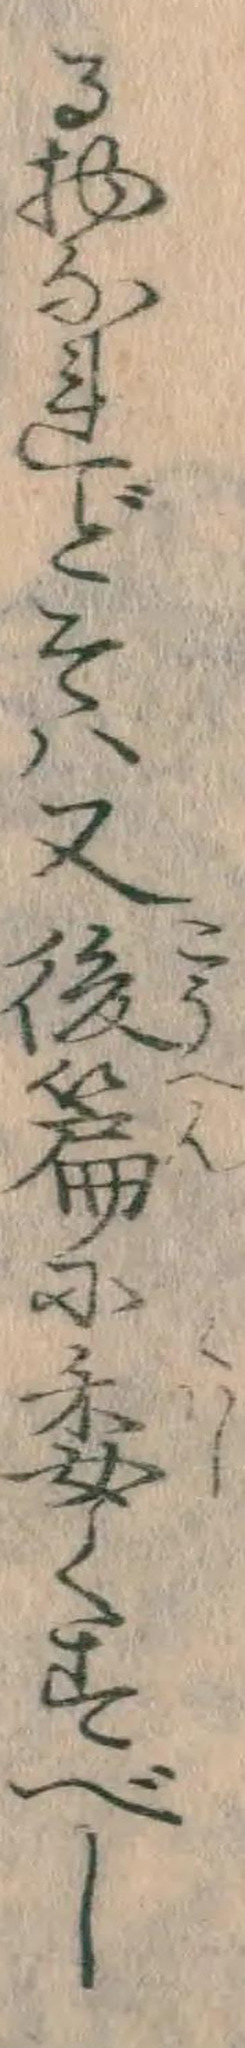る物なれどそは又後篇に委くすべし
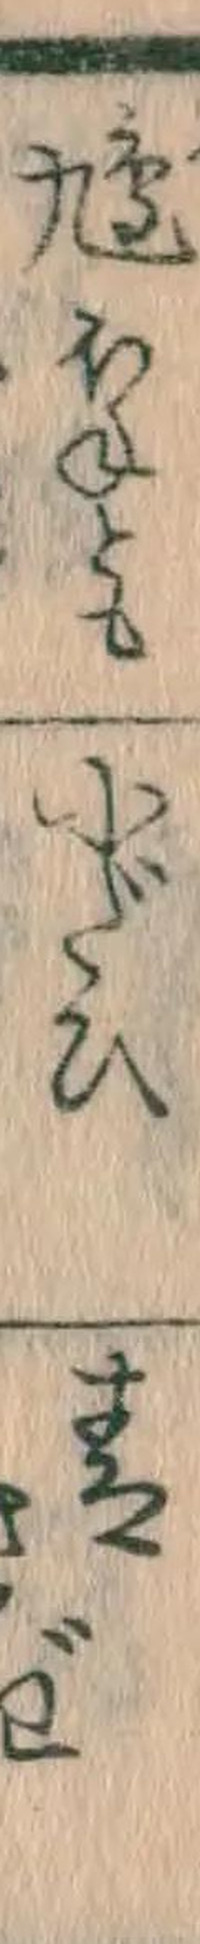鳩ほねとも小だひ青
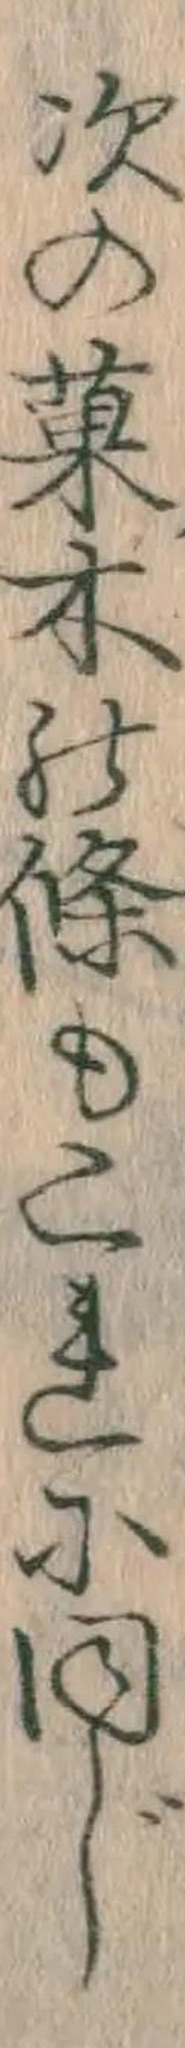次の菓木の条もこれに同じ
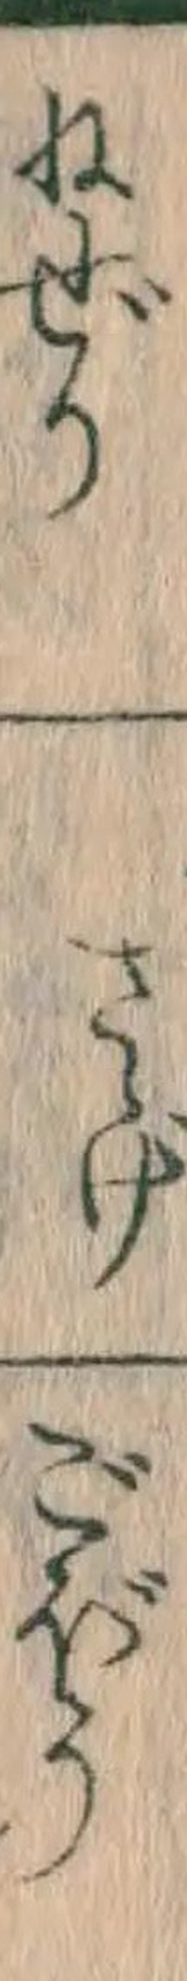ねぜりさゝげごばう
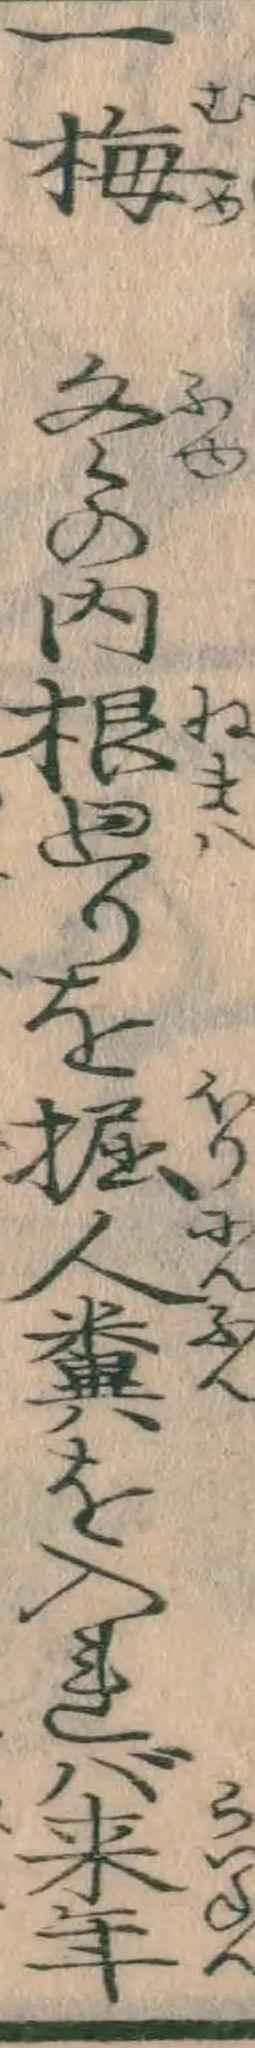一梅冬の内根廻りを掘人糞を入れば来年
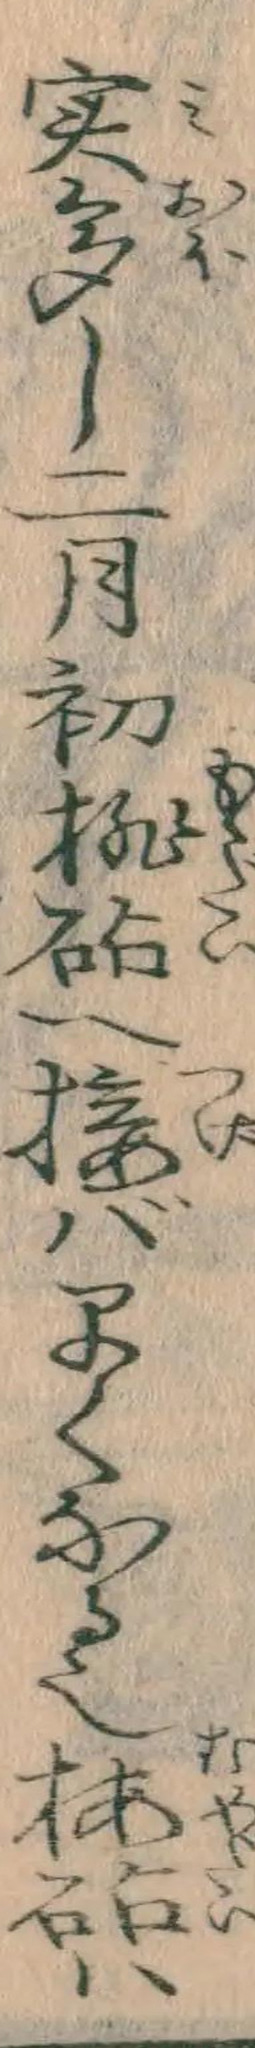実多し二月初桃砧へ接ば早くなる也梅砧は
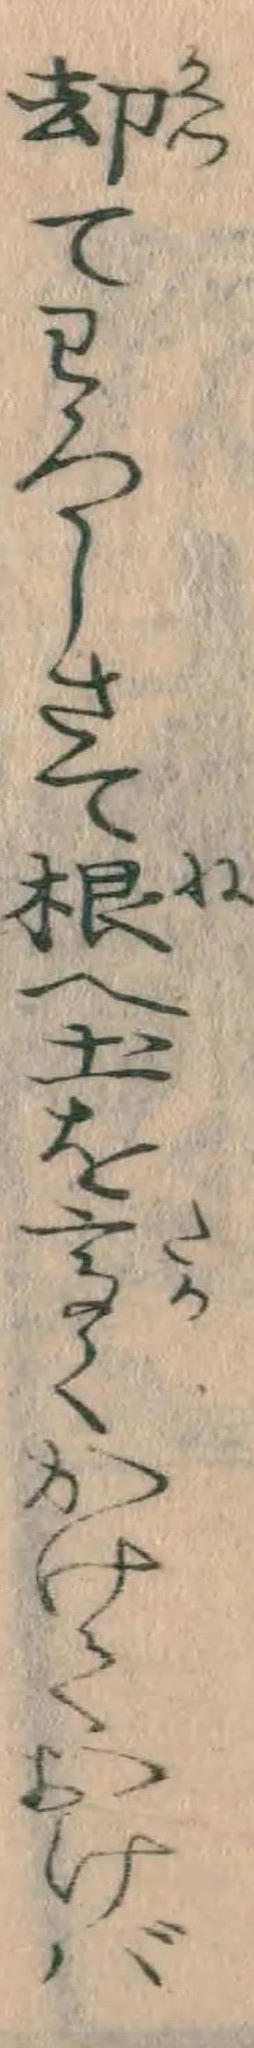却てわろしさて根へ土を高くかけておけば
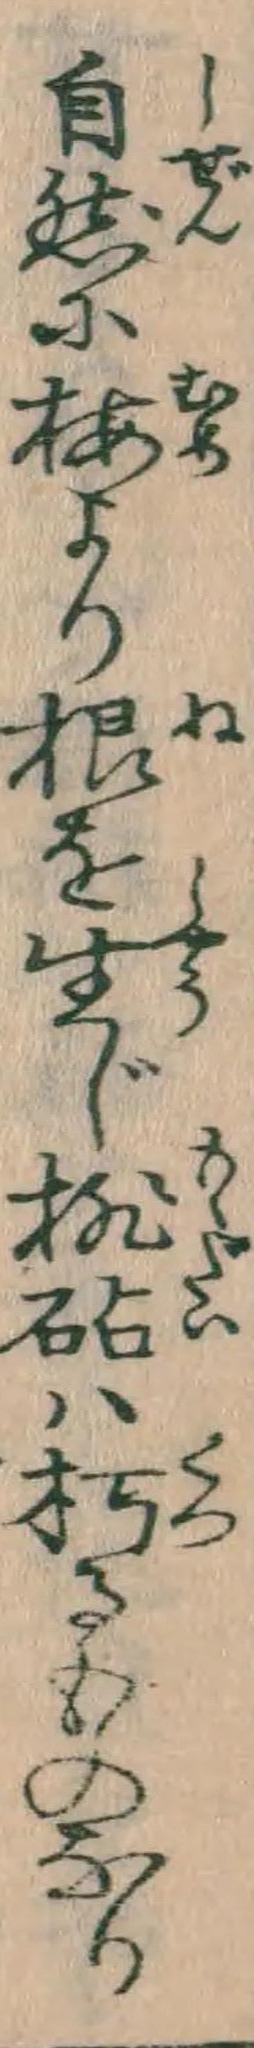自然に梅より根を生じ桃砧は朽るものなり
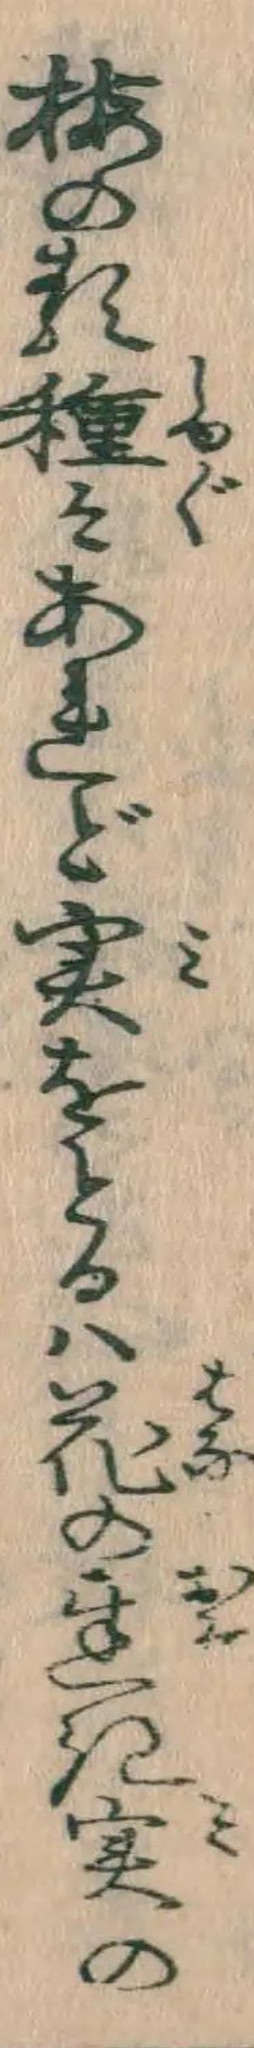梅の類種々あれど実をとるは花の遅き実の
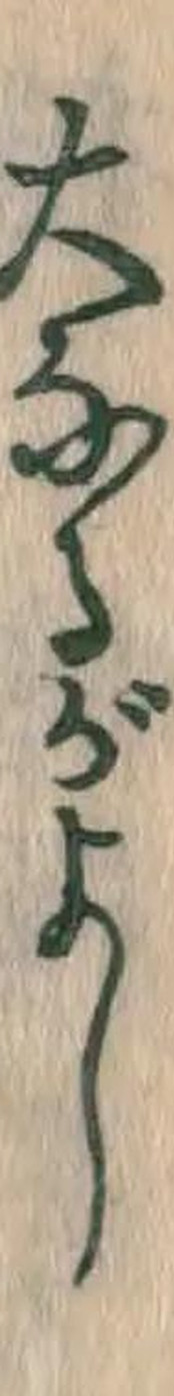大なるがよし
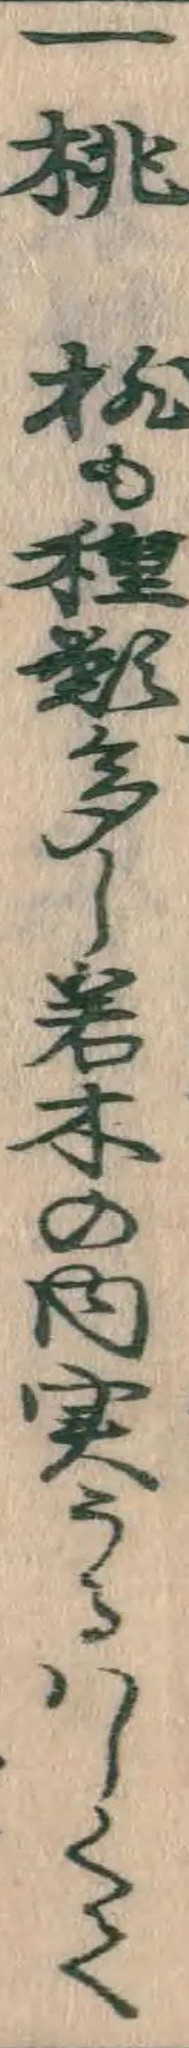一桃桃も種類多し若木の内実うるはしくて
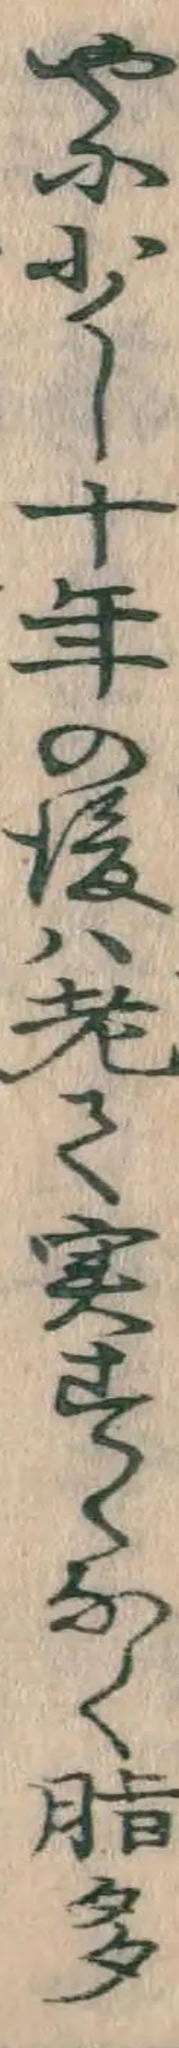やに少し十年の後は老て実すくなく脂多
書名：広益秘事大全 3巻. [5]
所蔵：国立国会図書館 National Diet Library, JAPAN
